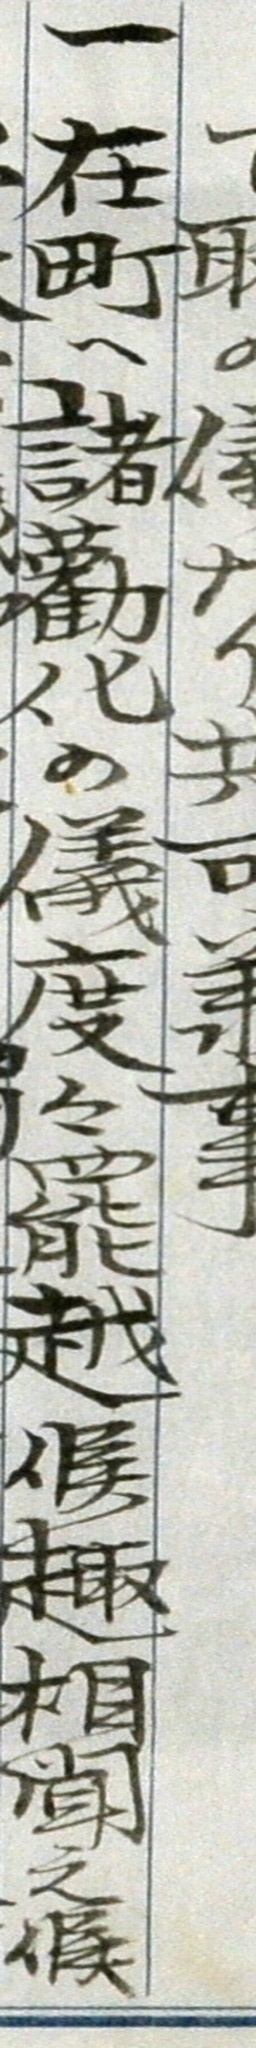一在町へ諸勤化の儀度々罷越候趣相聞之儀
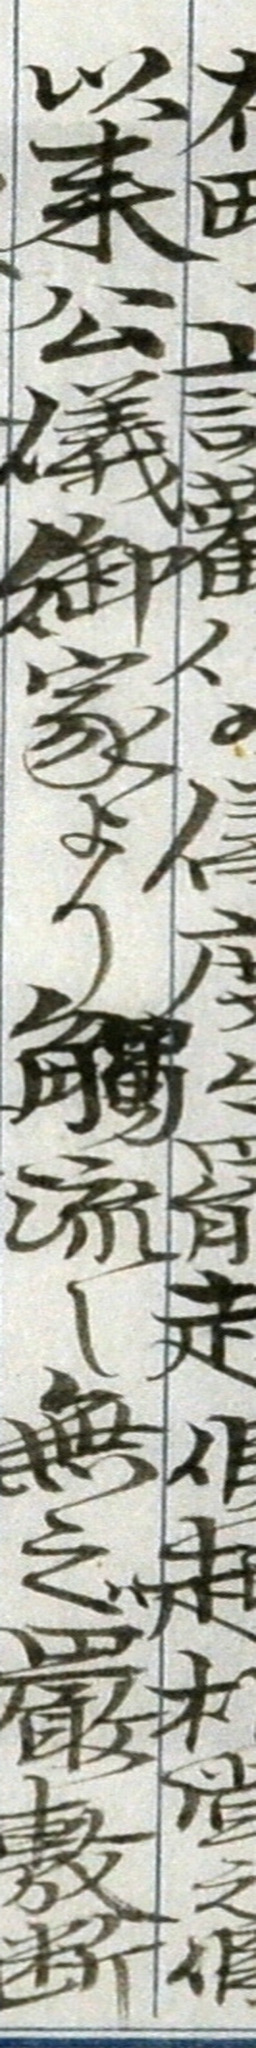以来公儀御家より触流し無之厳敷断
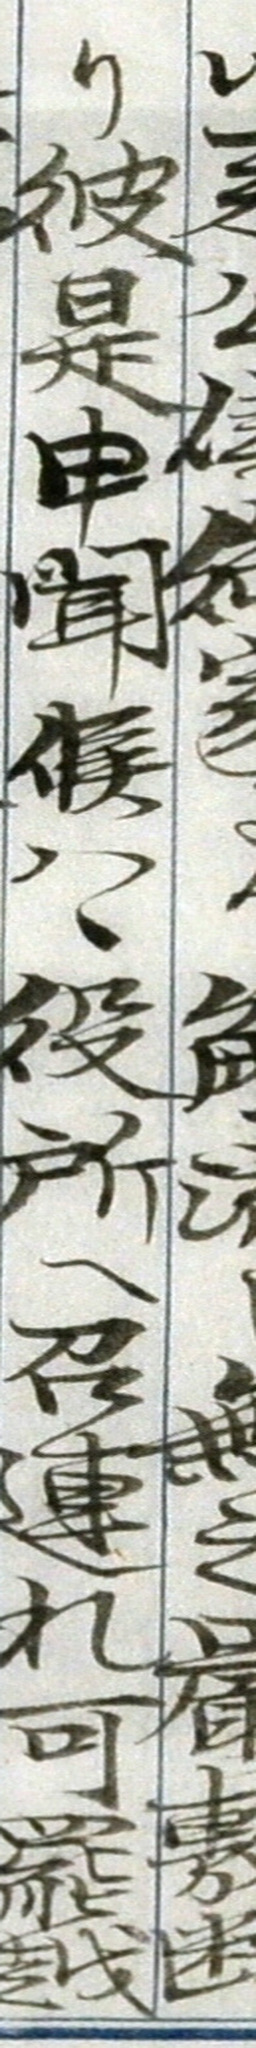り彼是申聞候ハヽ役所へ召連れ可罷越
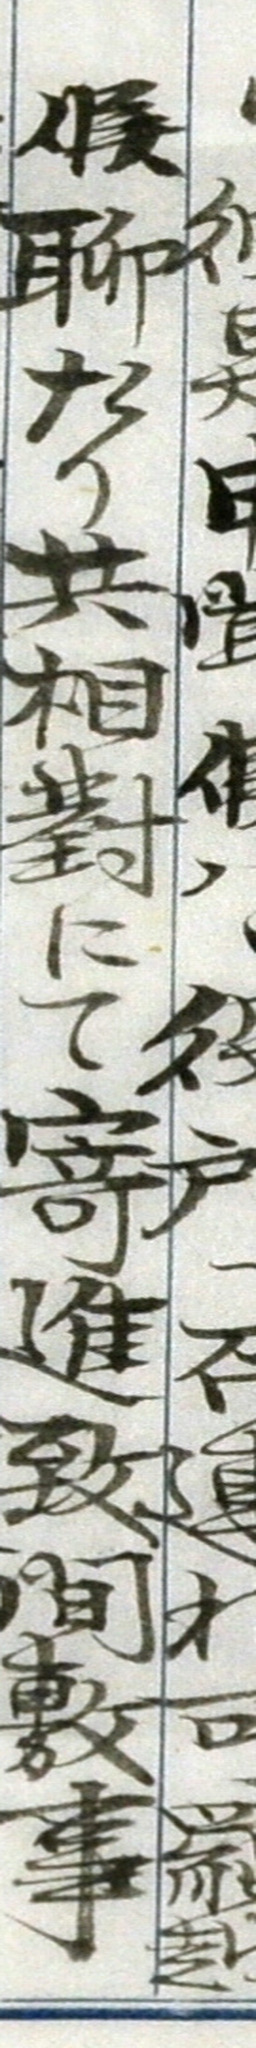候聊たり共相対にて寄進致間敷事
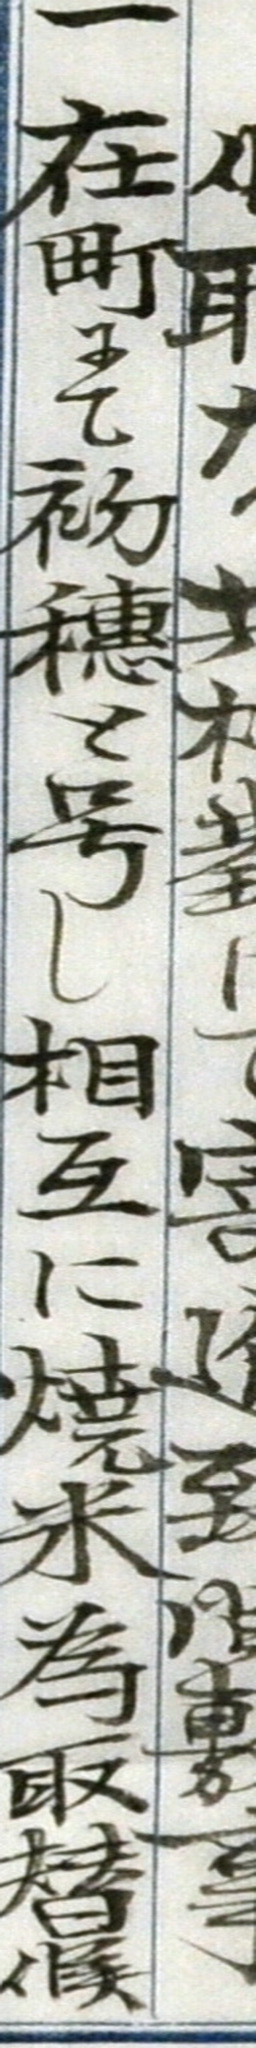一在町にて初穂と号し相互に焼米為取替候
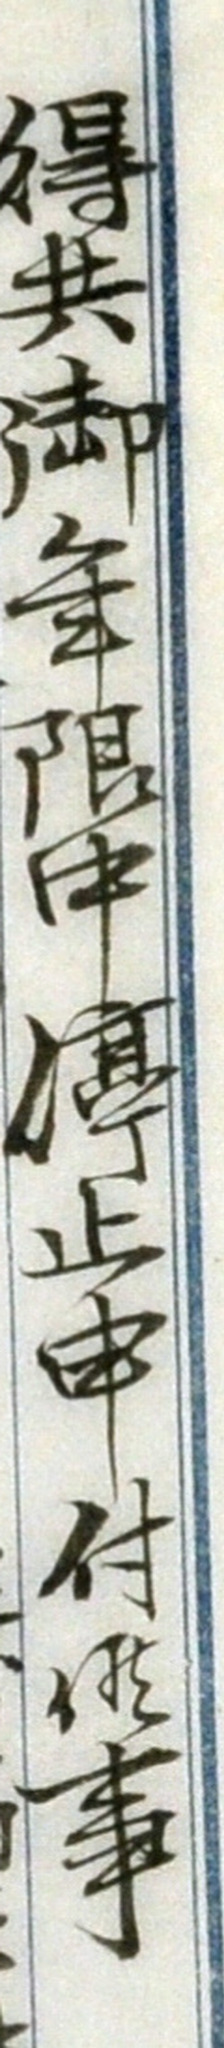得共御年限中停止申付候事
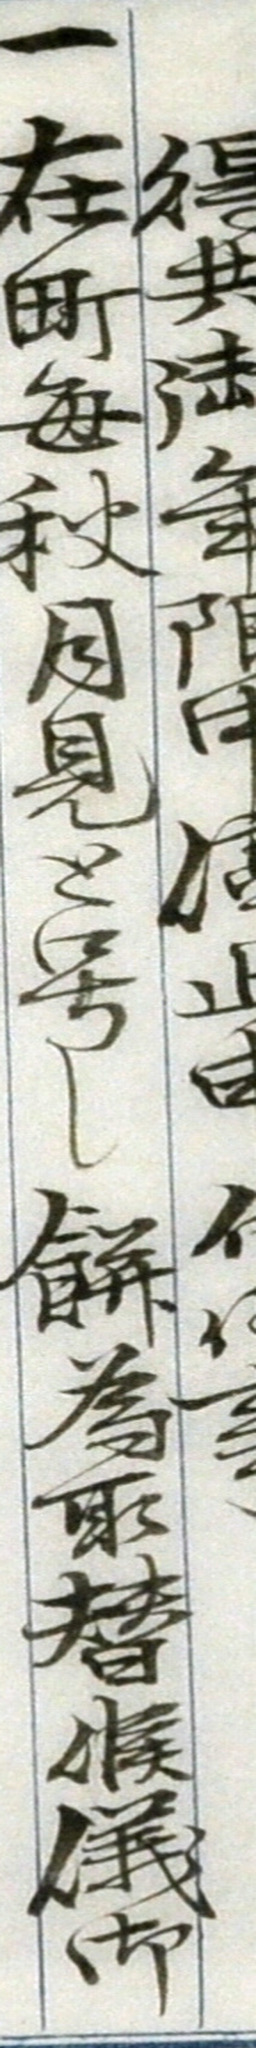一在町毎秋月見と号し餅為取替候儀御
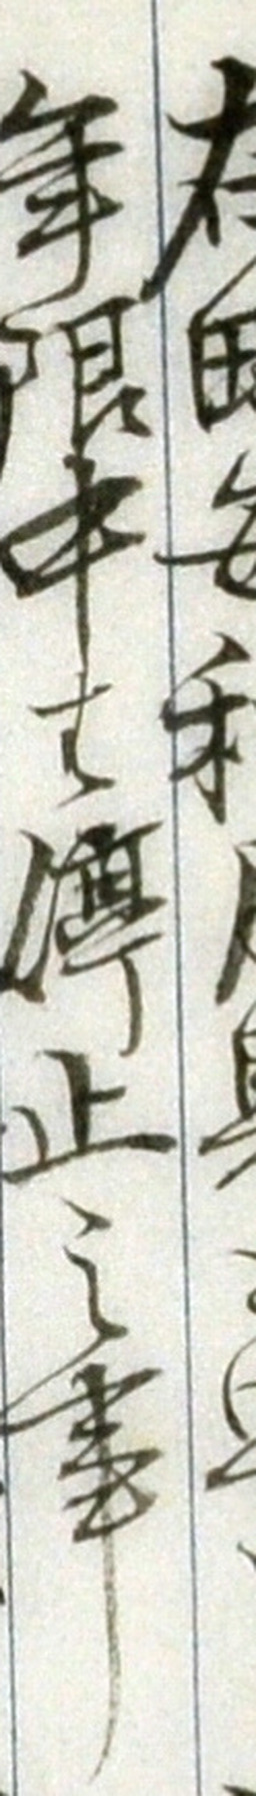年限中は停止之事
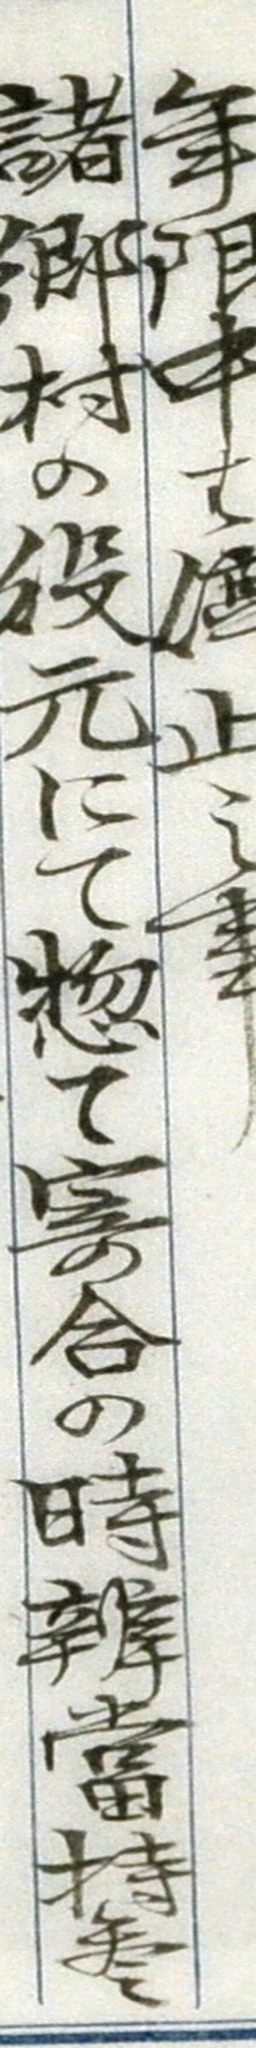一諸郷村の役元にて惣て寄合の時弁当持参
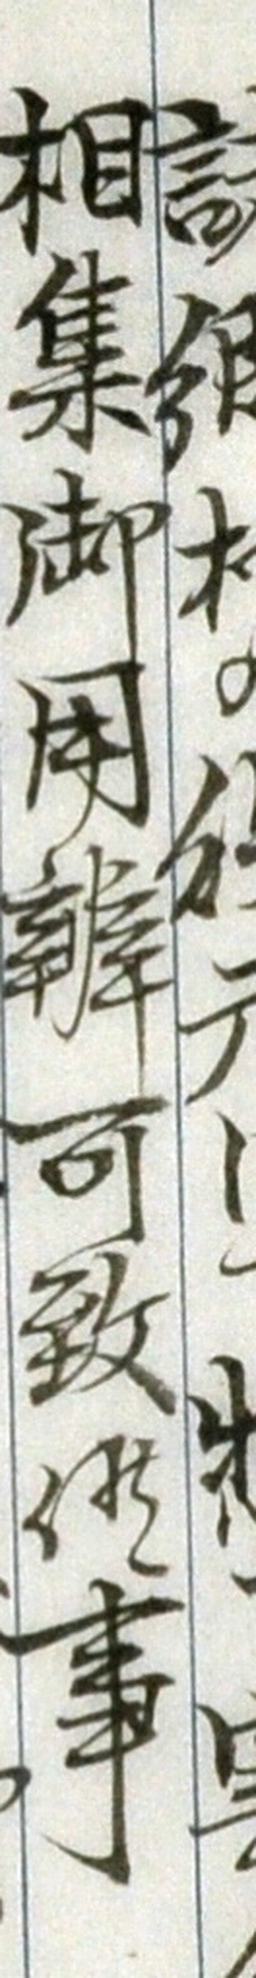相集御用弁可致候事
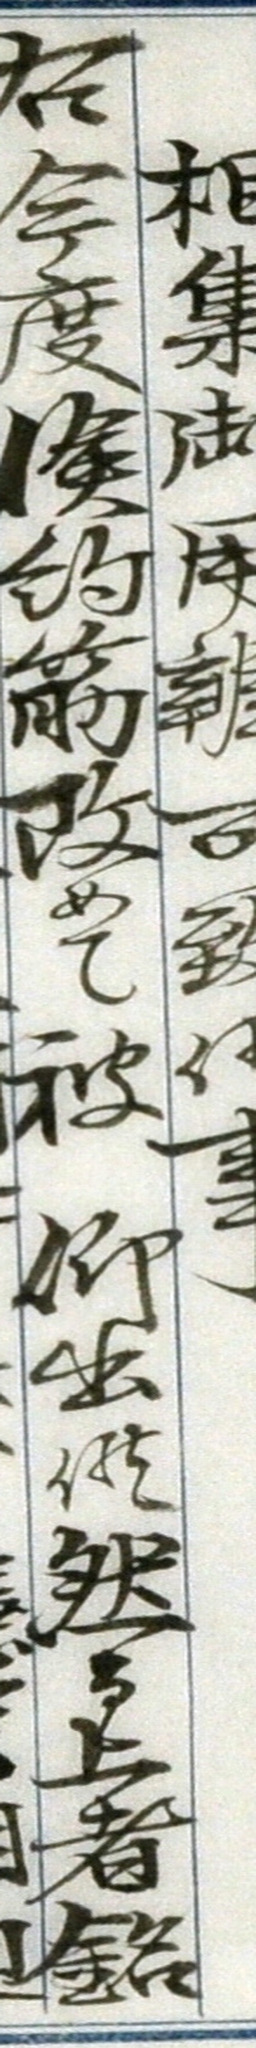右今度倹約筋改めて被仰出候然る上者銘
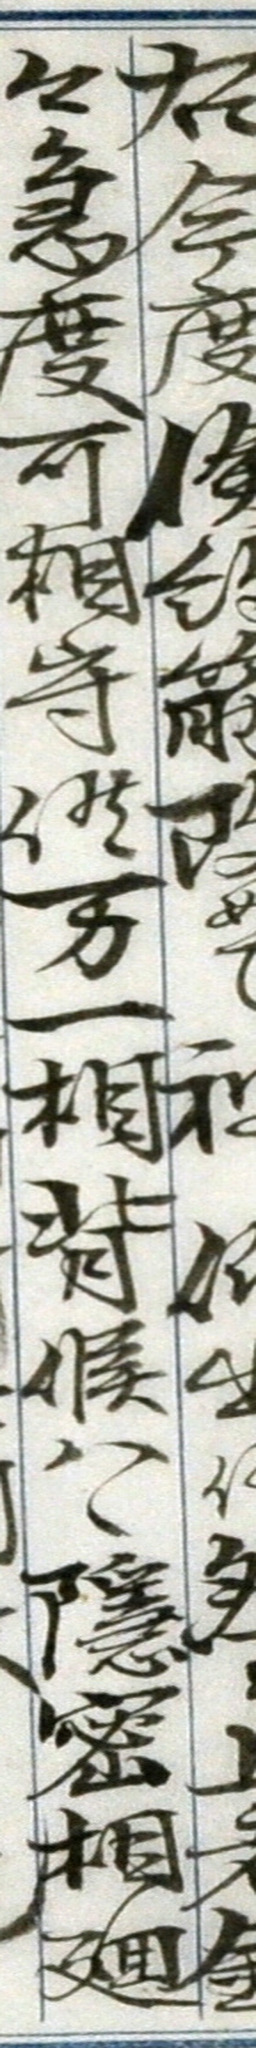々急度可相守候万一相背候ハヽ隠密相廻
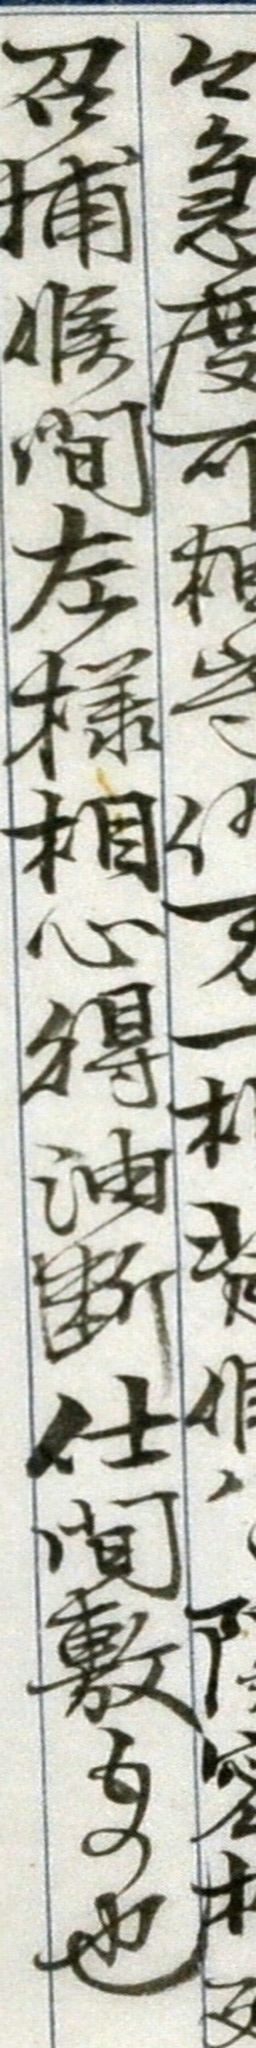召捕候間左様相心得油断仕間敷もの也
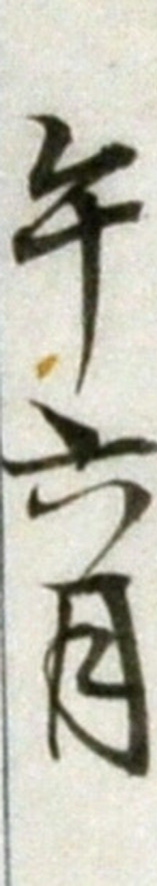午六月

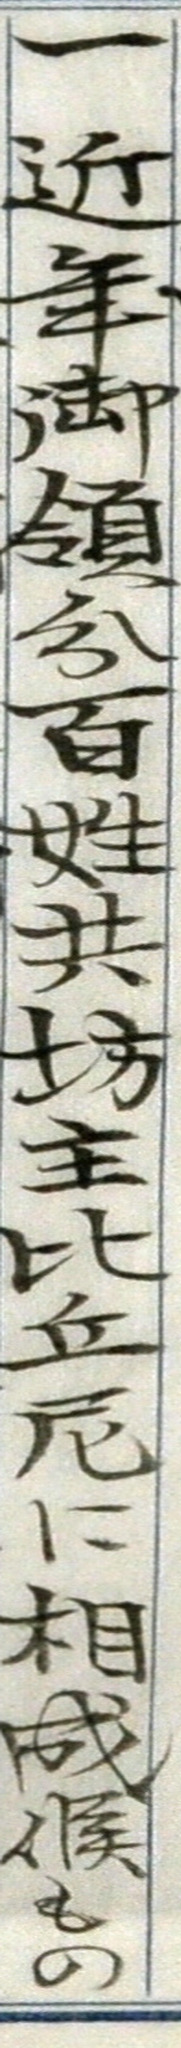一近年御領分百姓共坊主比丘尼に相成候もの
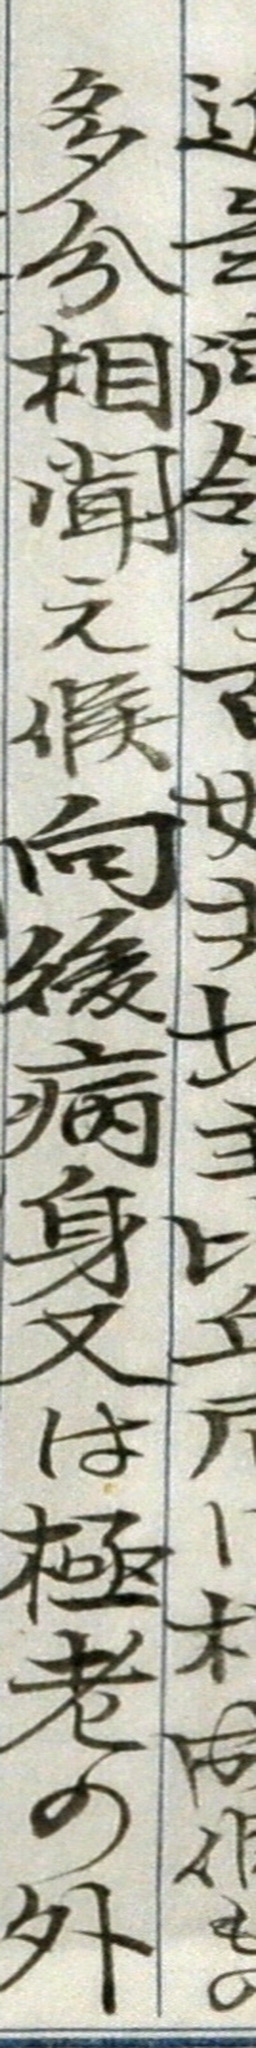多分相聞え候向後病身又は極老の外
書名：倹約筋御沙汰書
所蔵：伊那市立高遠町図書館・合同会社AMANE
